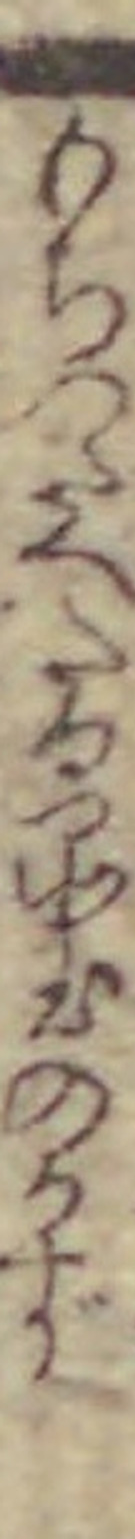もちつたへたる品玉のかず
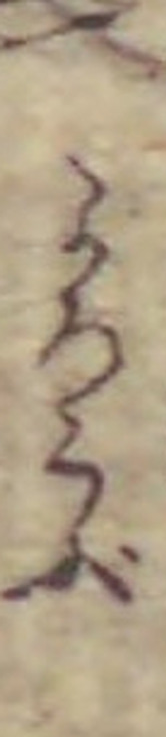よろこぶ
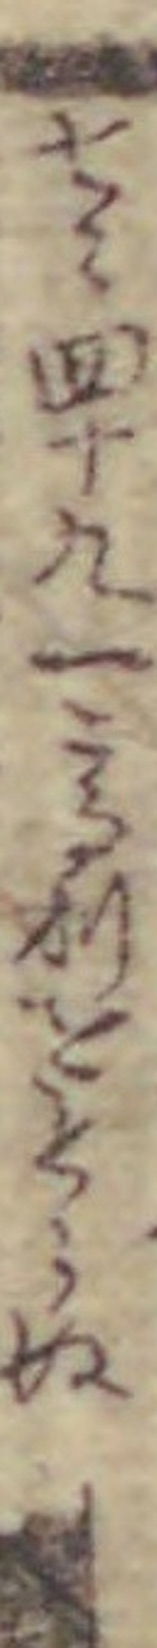七〃四十九一高利をとらぬ
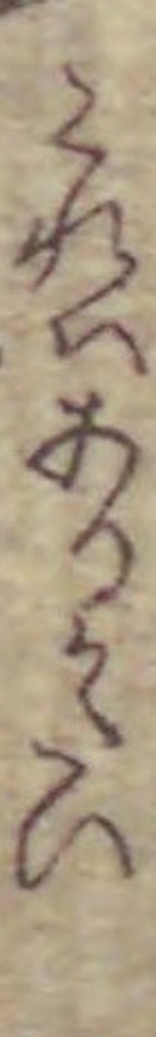これはありかたい
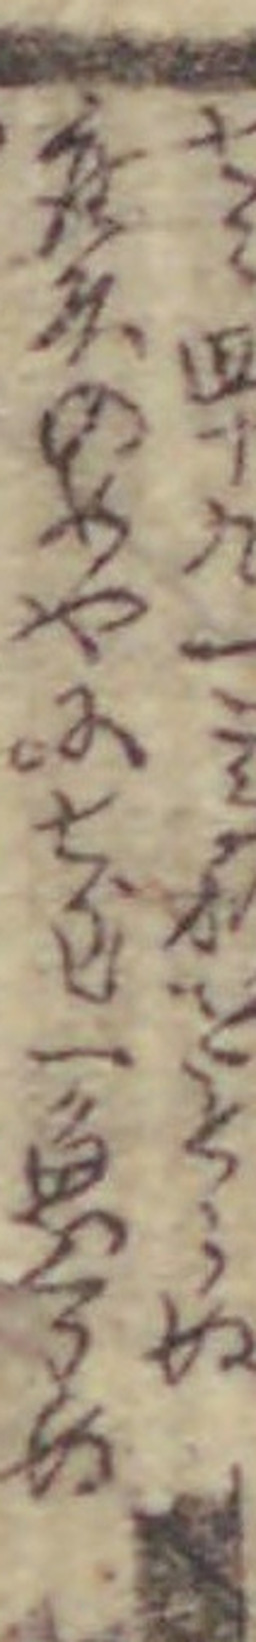座頭のめやに七匁一魚くわぬ
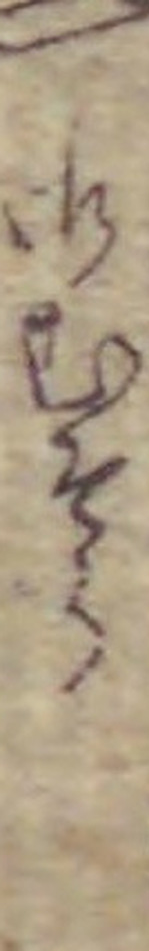御むそう
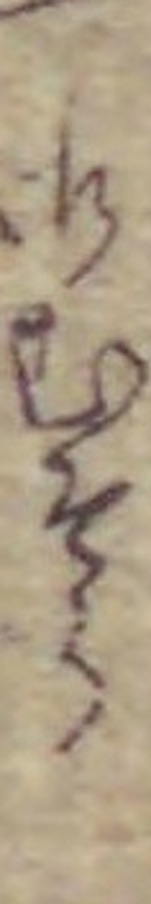御むそう
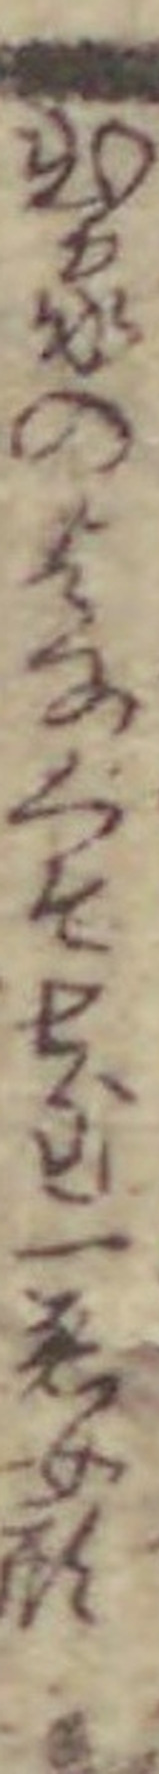出家のはなくそ七匁一若？女形
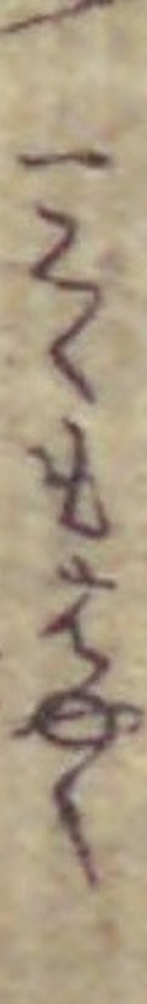一こくもはやく
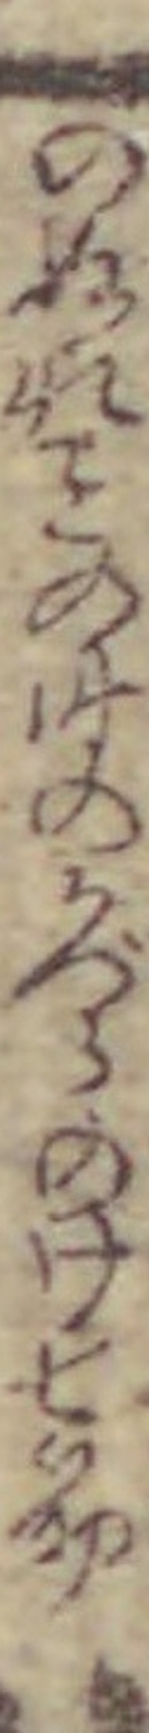のぬれことの時のかづらのけ七筋
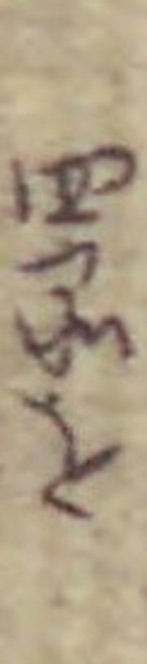四品を
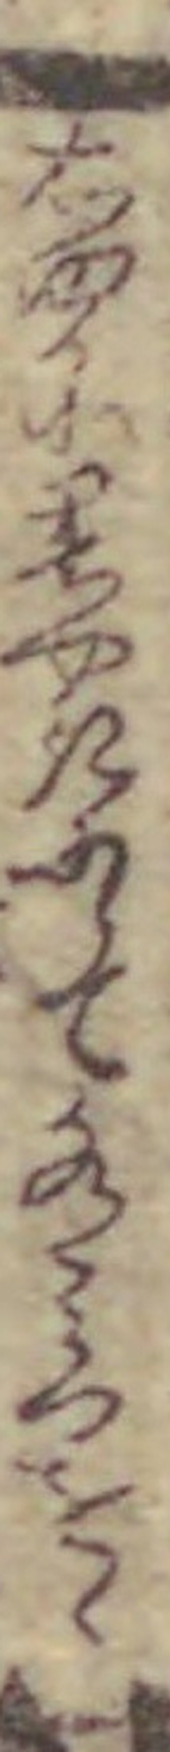右四品黒やきにして水はつをゝ
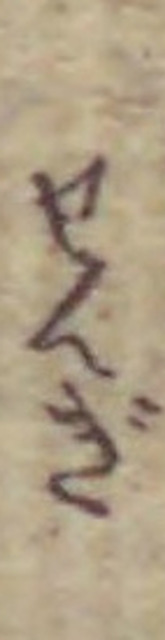せんぎ
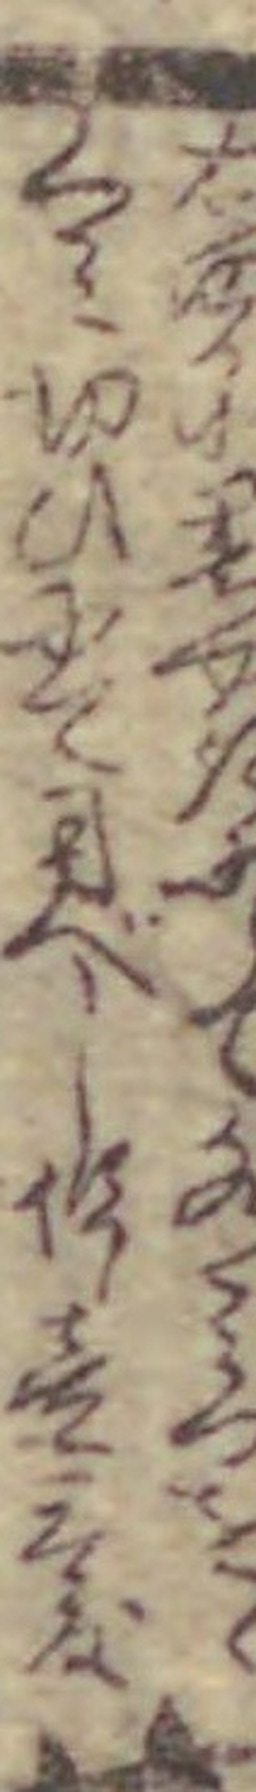くみ切ひにて用べし件昼三度
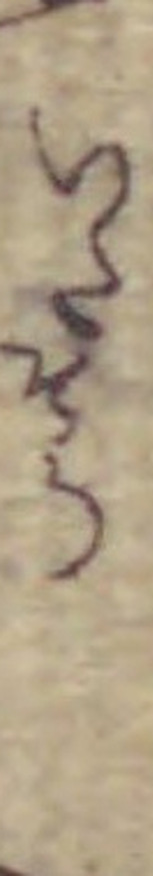いたそう
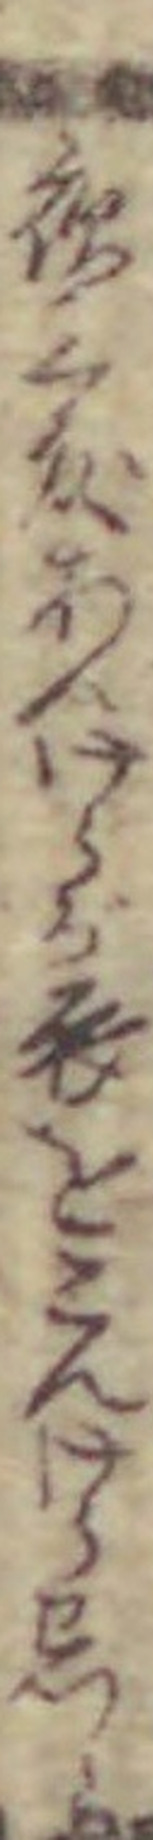夜三度あんけらが衣をこんけら着
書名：止而道致虚録 3巻
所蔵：国立国会図書館 National Diet Library, JAPAN
